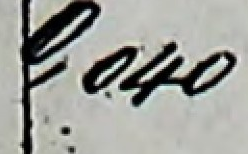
0,040
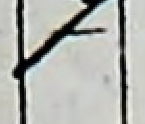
7
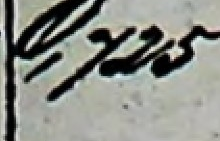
0,725
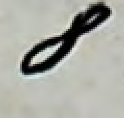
8
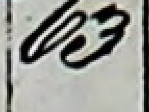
63
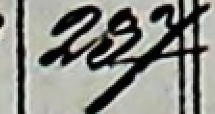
237
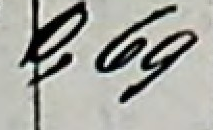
0,69
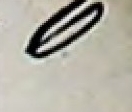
6
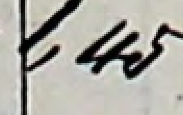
1,45
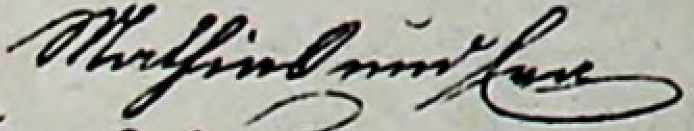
Mathias und Eva
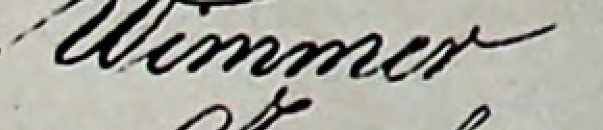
Wimmer
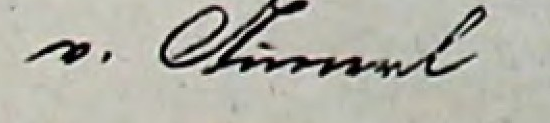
v. Annerl
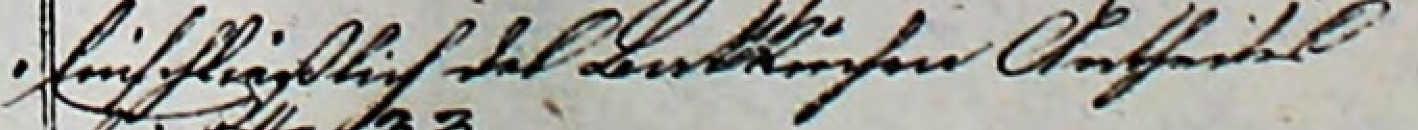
Einschließlich des Bakküchen Antheiles
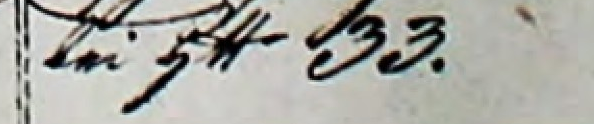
bei H? 33.
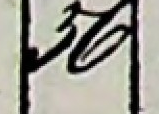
56
